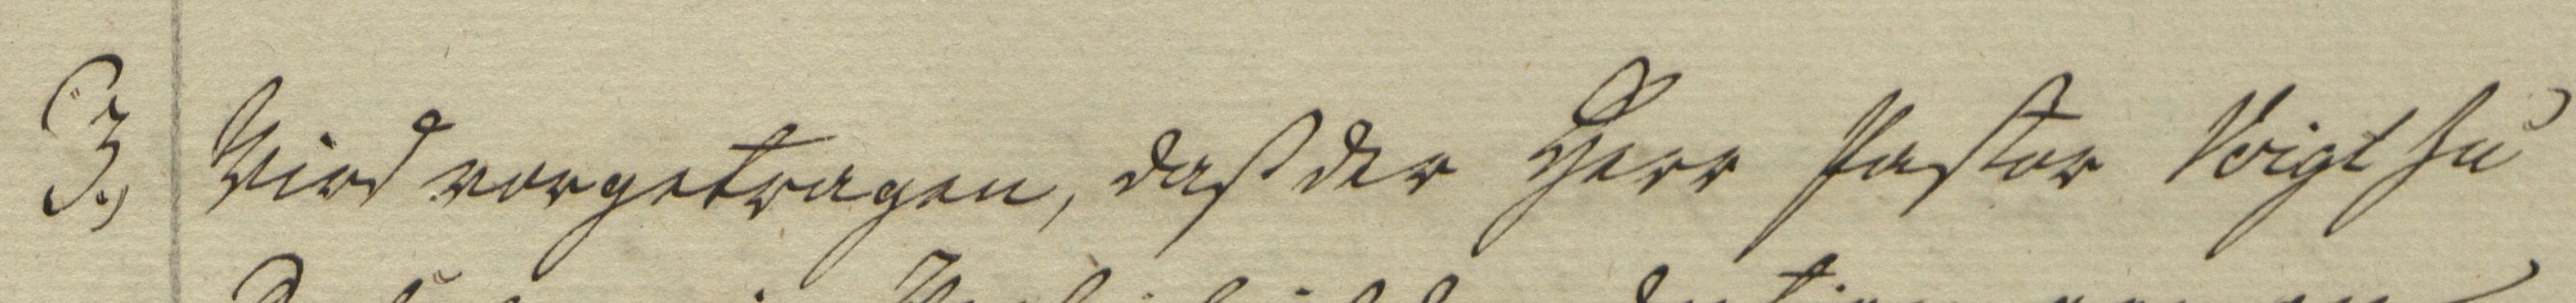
3. Wird vorgetragen, daß der Herr Pastor Voigt zu
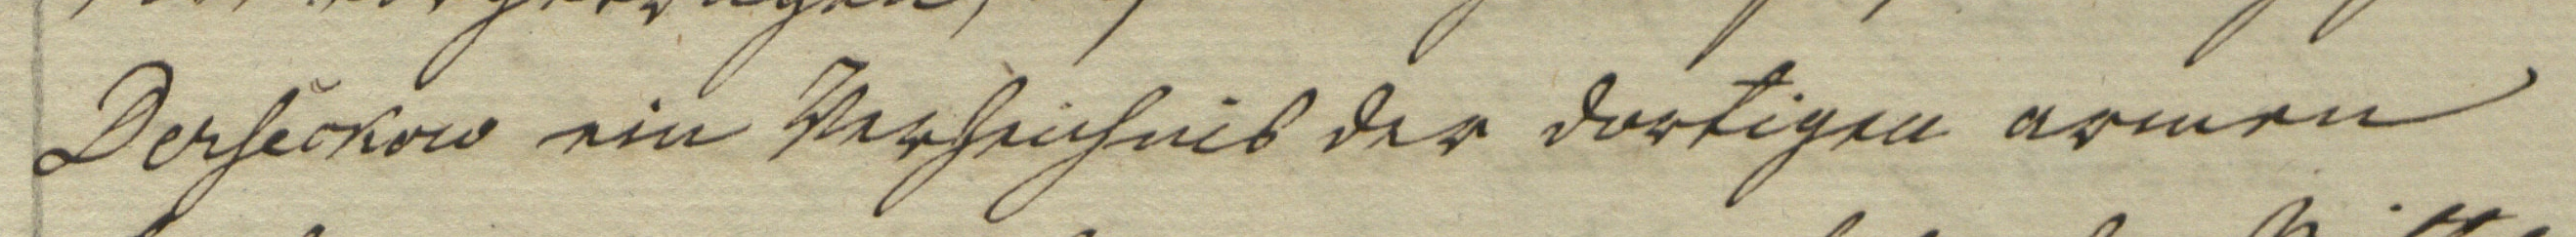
Derseckow ein Verzeichnis der dortigen armen
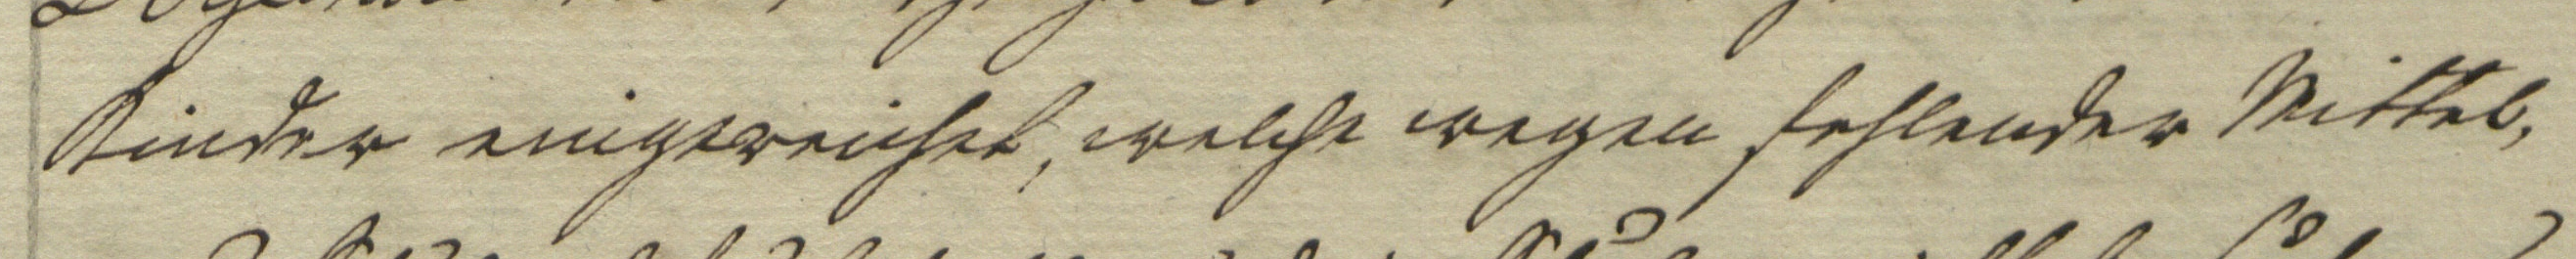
Kinder eingereichet, welche wegen fehlender Mittel,
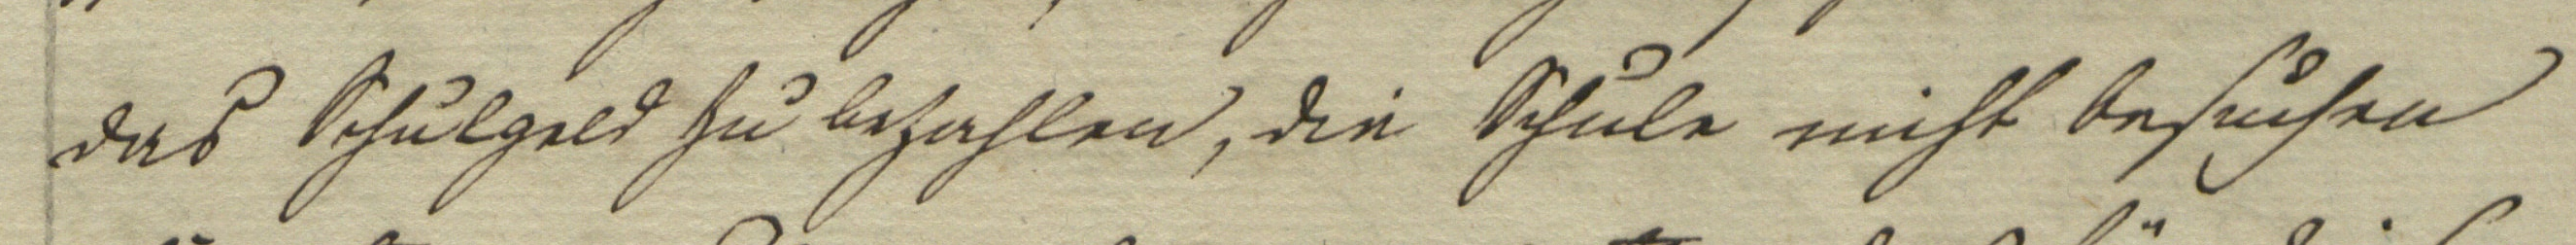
das Schulgeld zu bezahlen, die Schule nicht besuchen
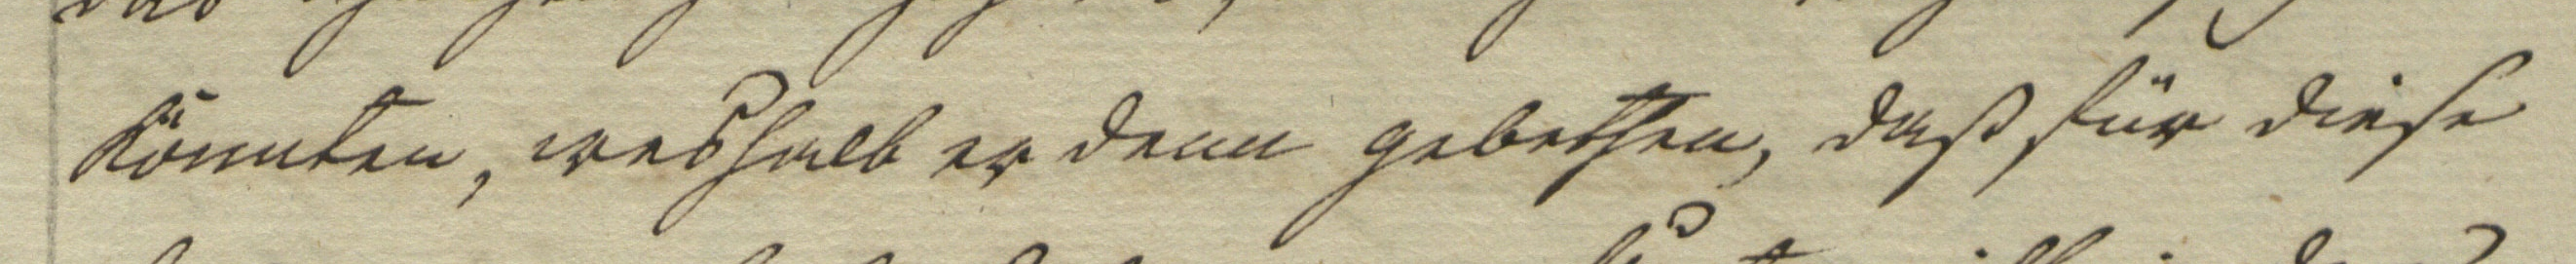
könnten, weshalb er denn gebethen, daß für diese
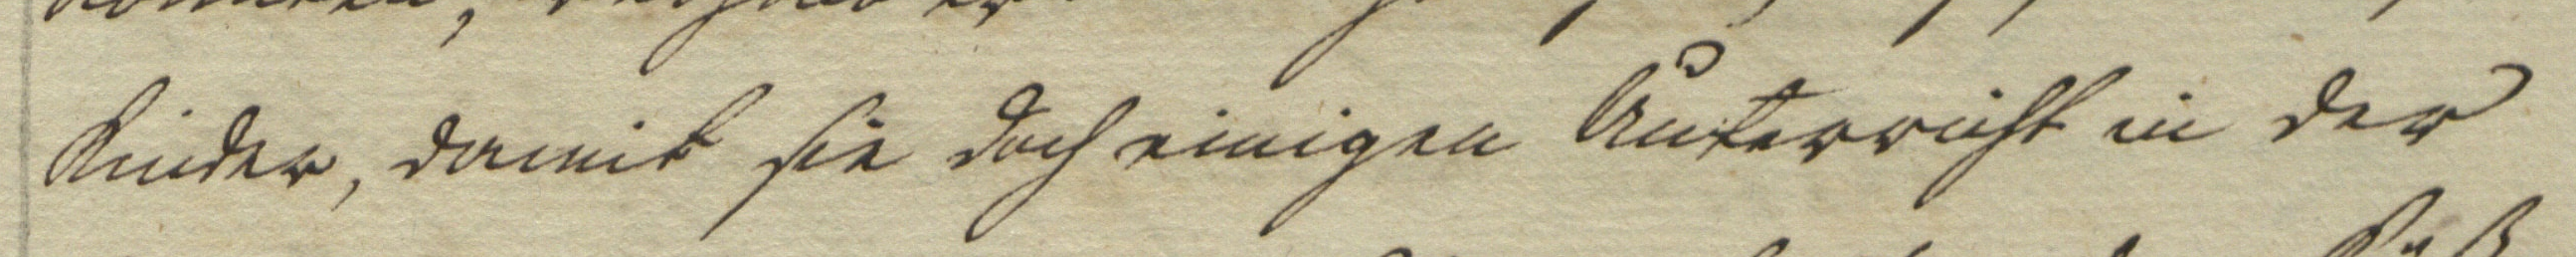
Kinder damit sie doch einigen Unterricht in der
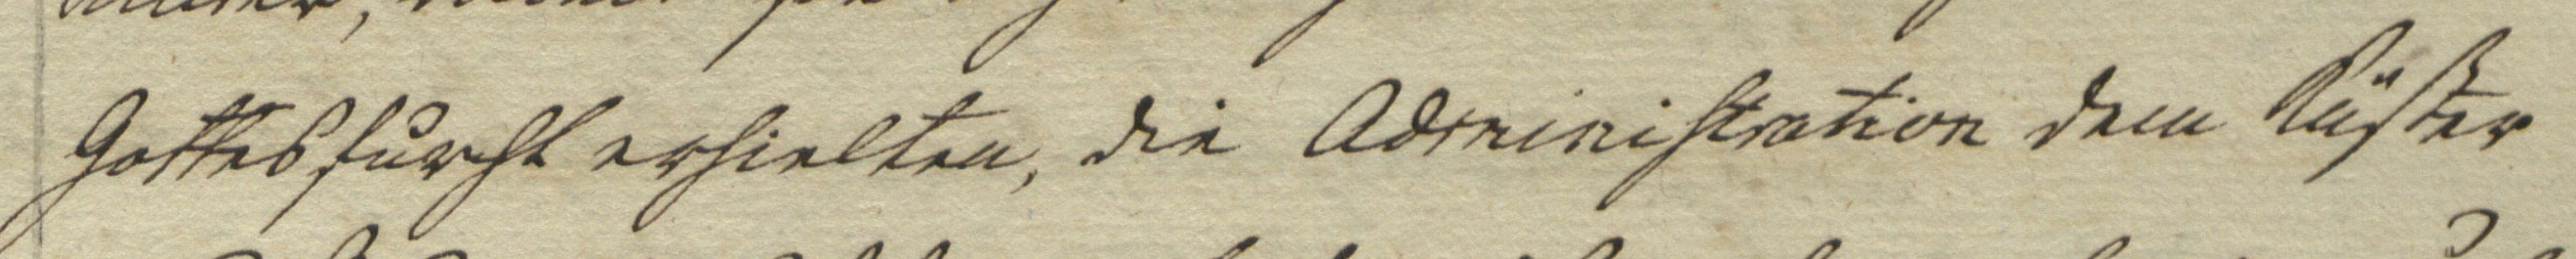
Gottesfurcht erhielten, die Administration dem Küster
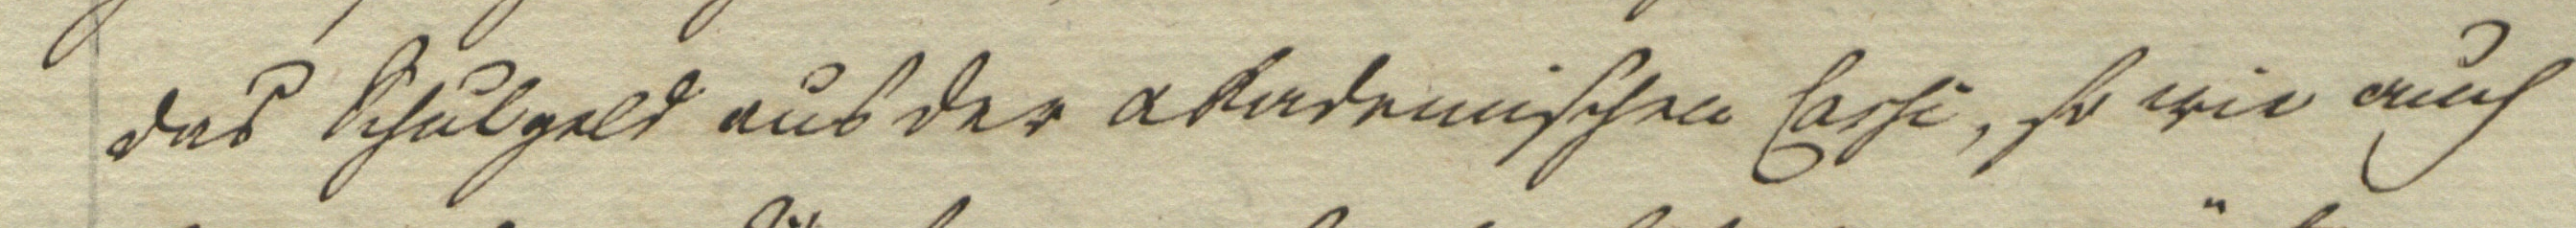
das Schulgeld aus der akademischen Casse, so wie auch
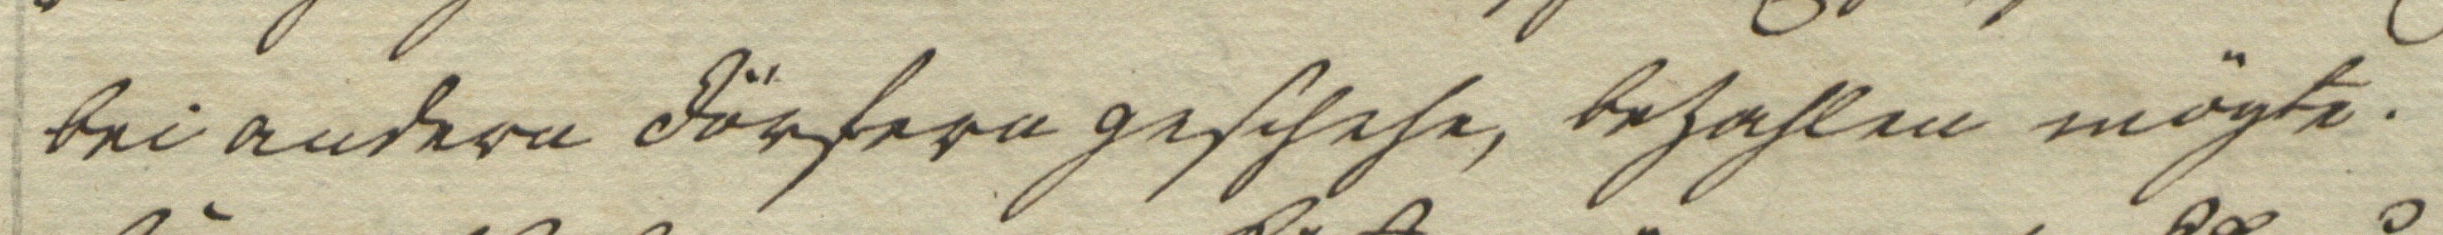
bei andern Dörfern geschehe, bezahlen mögte.
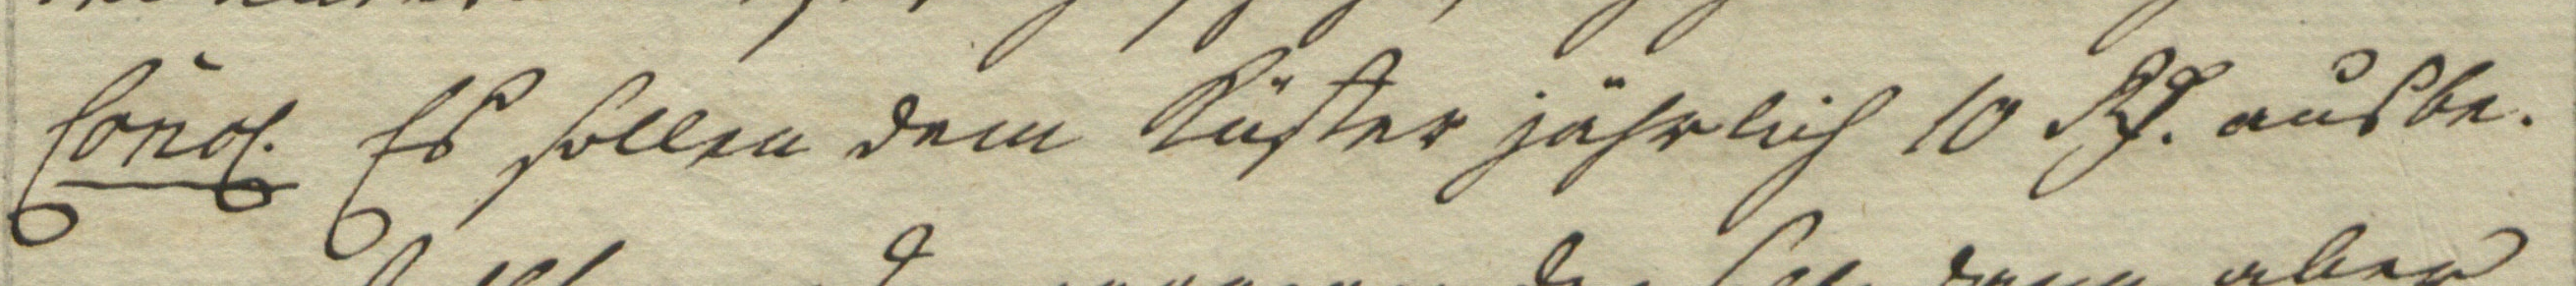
Concl. Es sollen dem Küster jährlich 10 Rf. ausbe¬
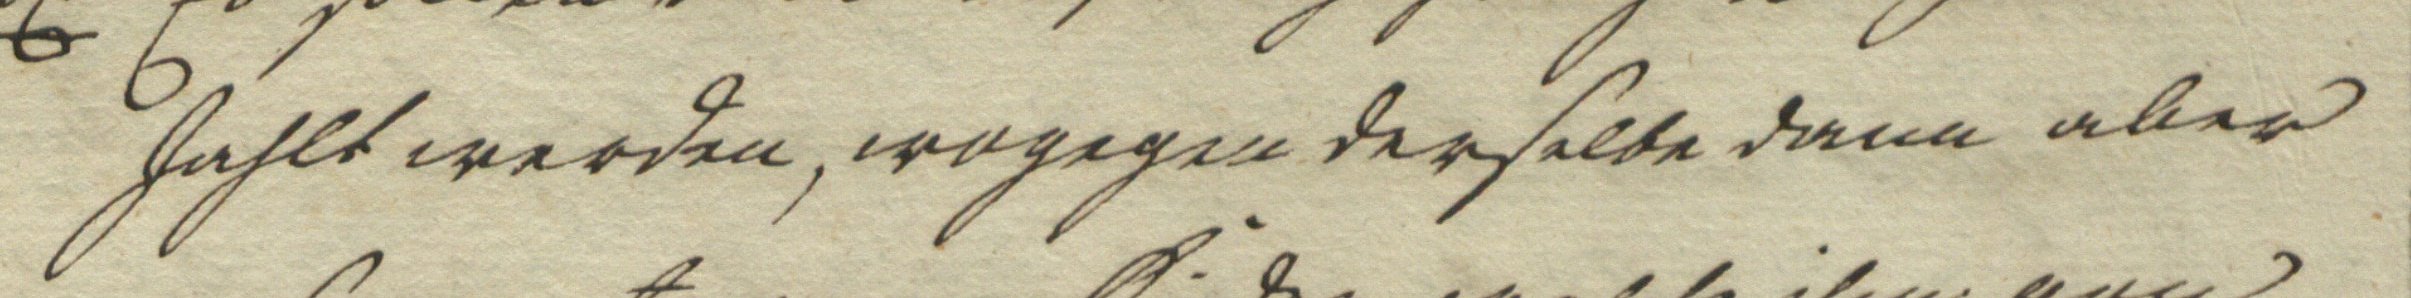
zahlt werden, wogegen derselbe dann aber
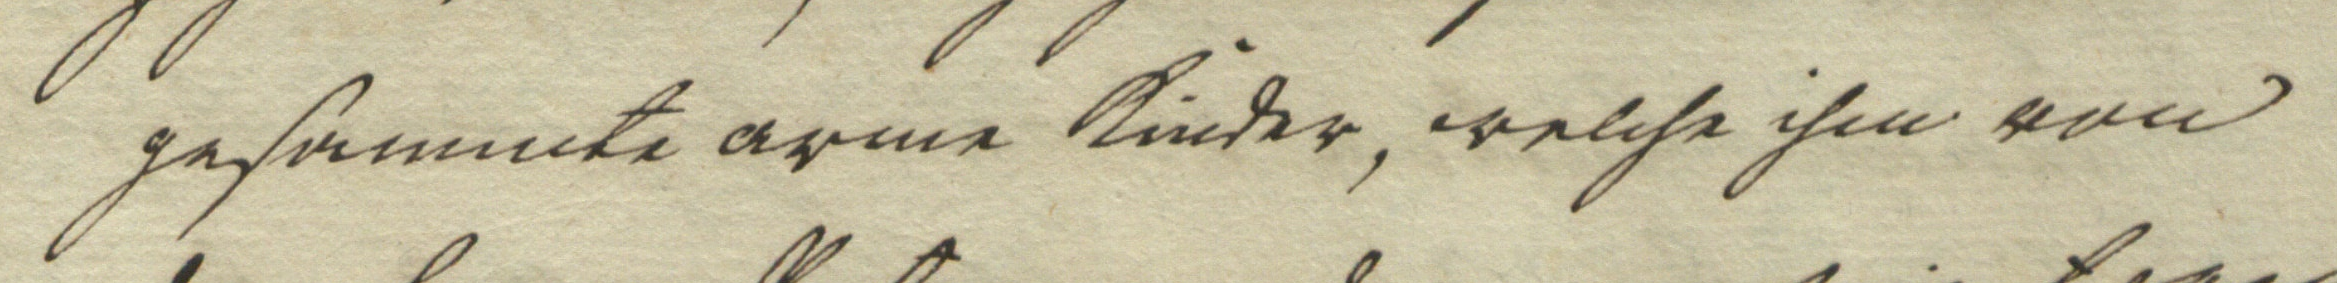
gesammte armen Kinder, welche ihm von
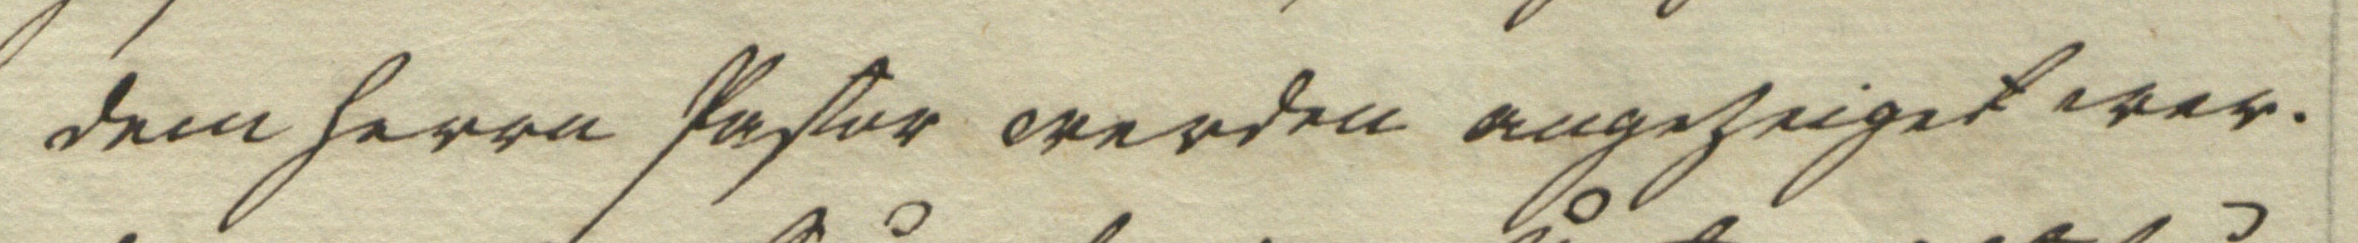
dem Herrn Pastor werden angezeiget wer¬
